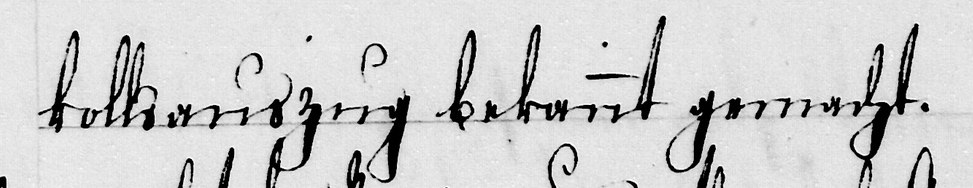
kollsauszug bekannt gemacht.
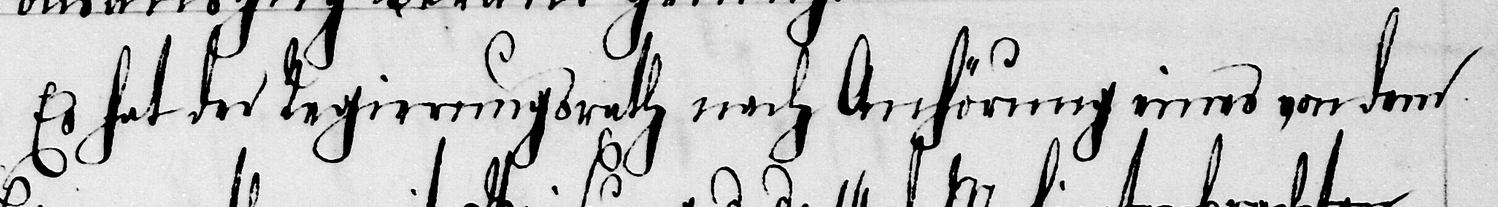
Es hat der Regierungsrath nach Anhörung eines von dem
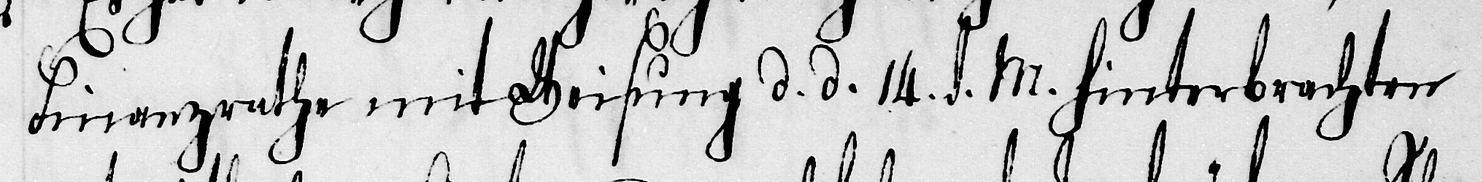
Finanzrathe mit Weisung d. d. 14. d. M. hinterbrachten
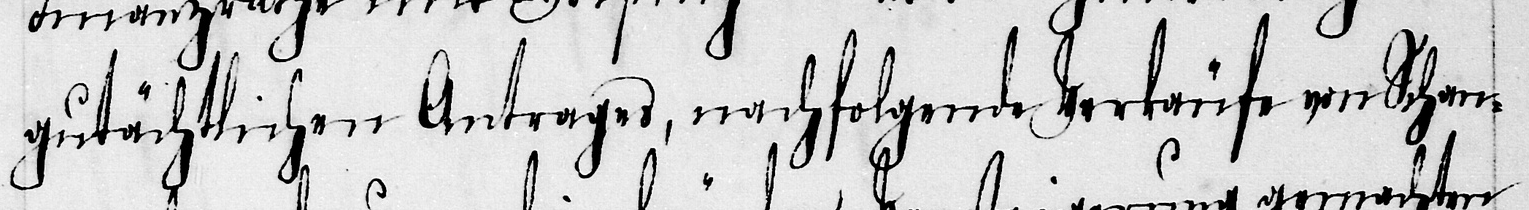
gutächtlichen Antrages, nachfolgende Verkäufe von Schan¬
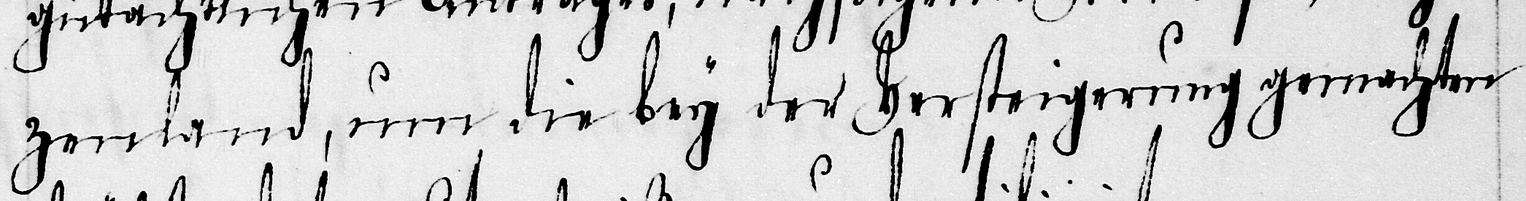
zenland, um die bey der Versteigerung gemachten
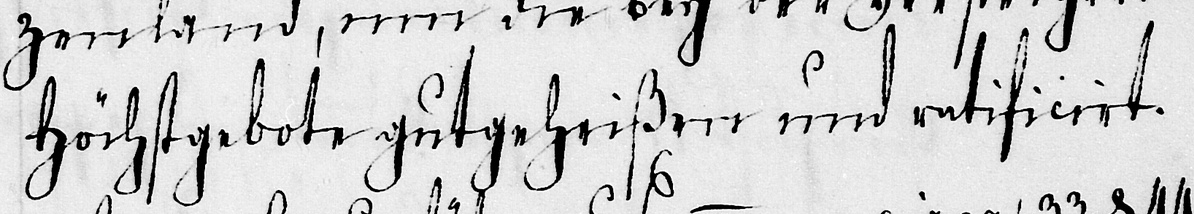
Höchstgebote gutgeheißen und ratificirt.
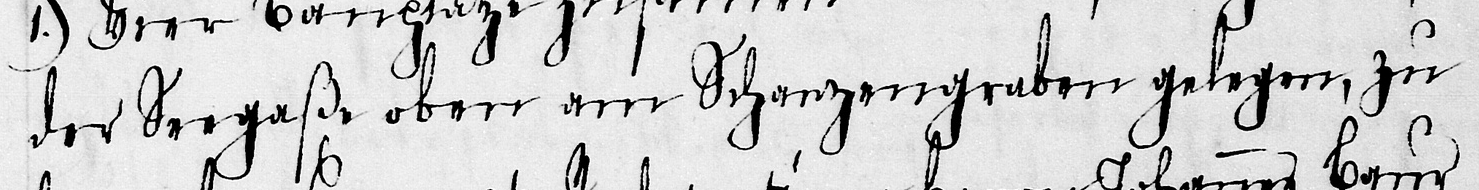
der Seegaße oben am Schanzengraben gelegen, zu
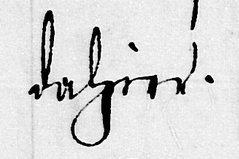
dahier.
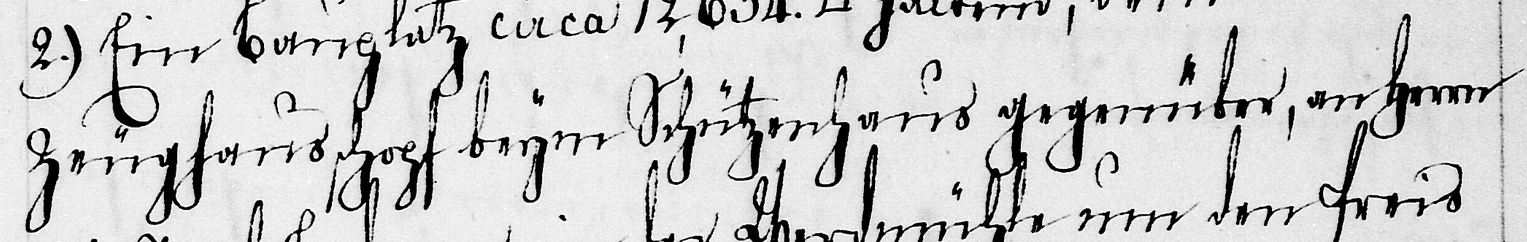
Zeughausschopf beym Schützenhaus gegenüber, an Herrn
